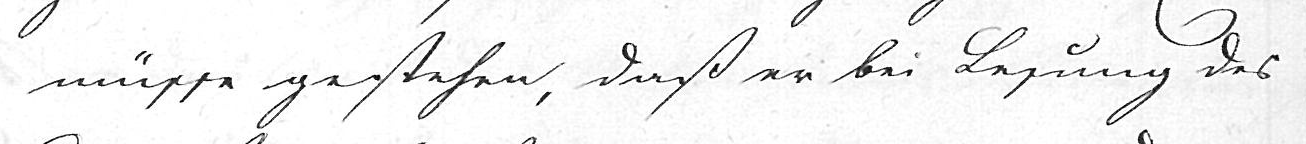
müsse gesehen, daß er bei Lesung des
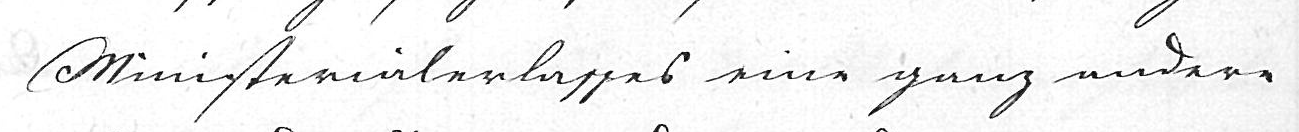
Ministerialerlasses eine ganz andere
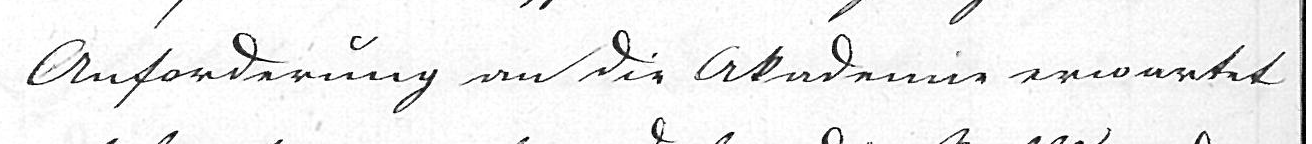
Anforderung an die Akademie erwartet
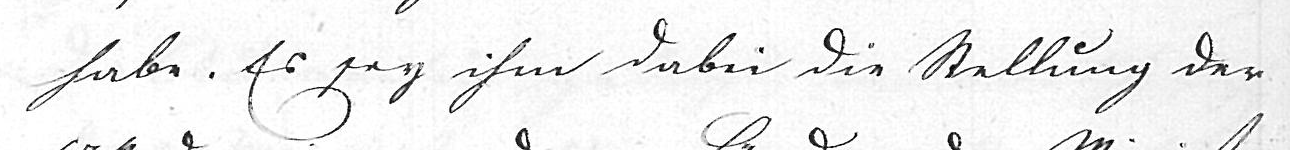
habe. Es sey ihm dabei die Stellung der
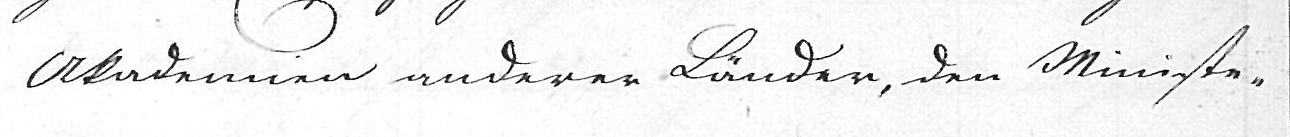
Akademien anderer Länder, den Ministe-
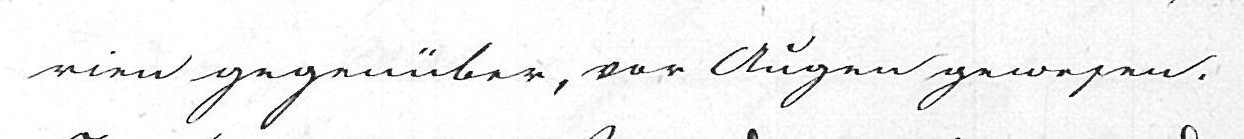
rien gegenüber, vor Augen gewesen.
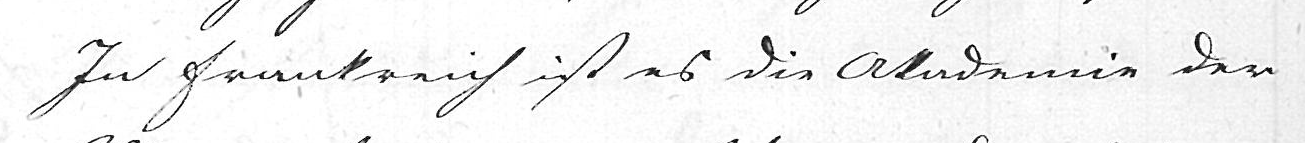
In Frankreich ist es die Akademie der
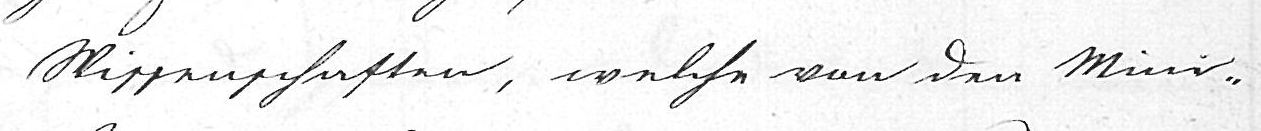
Wissenschaften, welche von den Mini-
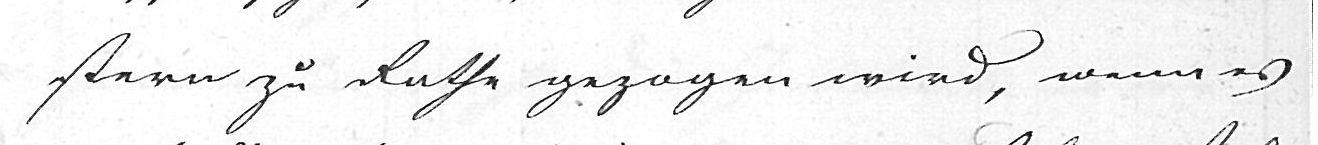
stern zu Rathe gezogen wird, wenn es
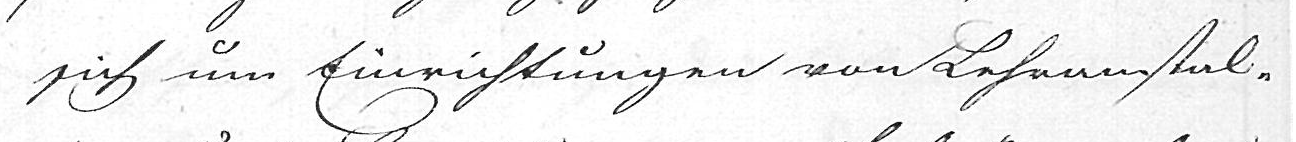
sich um Einrichtungen von Lehranstal-
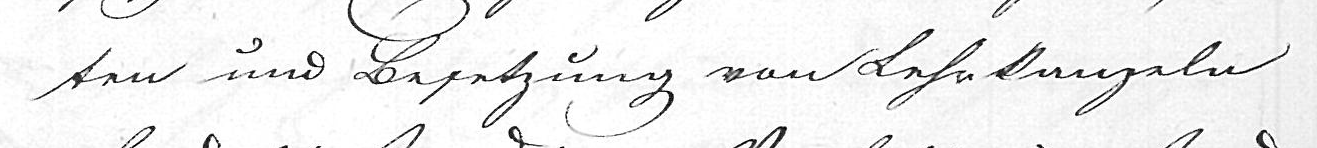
ten und Besetzung von Lehrkanzeln
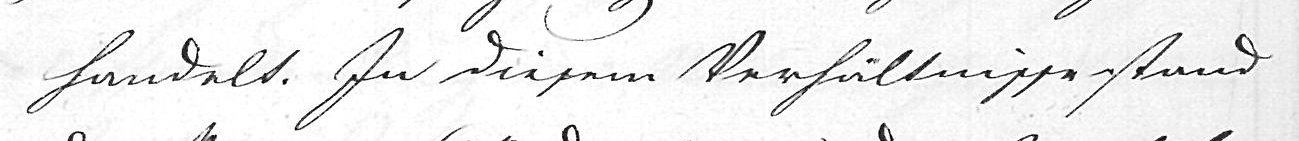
handelt: In diesem Verhältnisse stand
